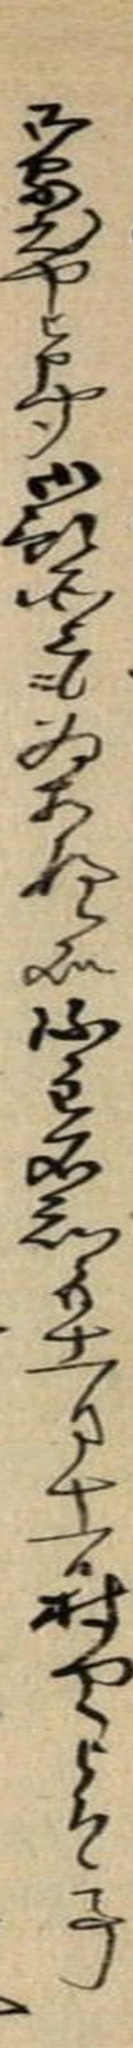御家老中被申聞御預所迄も為相尋候処弥主不知に付十一月十一日村中へ被下候事
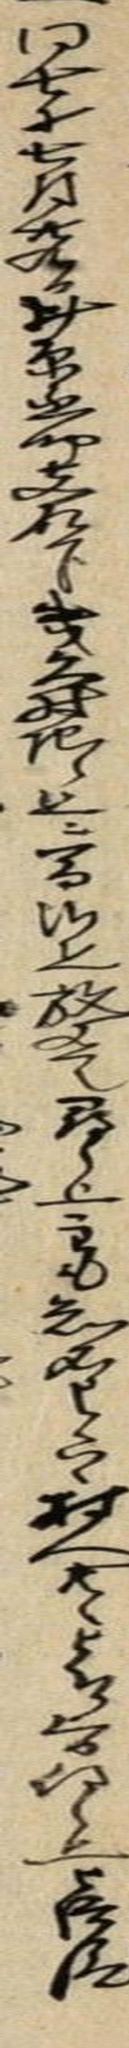一同七刁七月廿九日井原丞助支配下幾久村地之上に馬弐疋放有之尋之上主も知不申候はゝ村人共へ被下候旨伺之上被仰渡
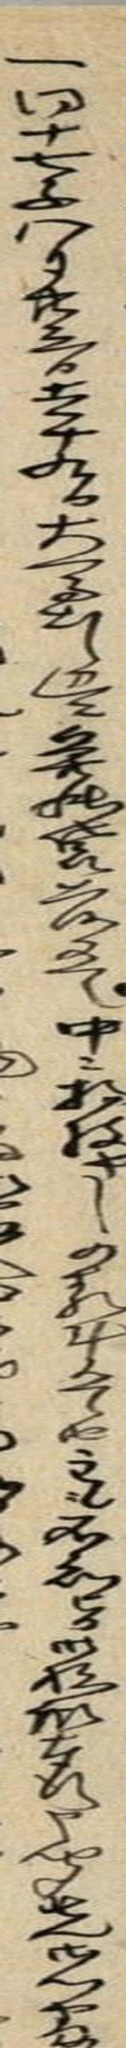一同十七子八月廿三日去十九日大馬出し辺に鼻紙袋落有之中に楊枝さしの類斗有之由主も不知旨御杉形奉行申聞先御門番之方に
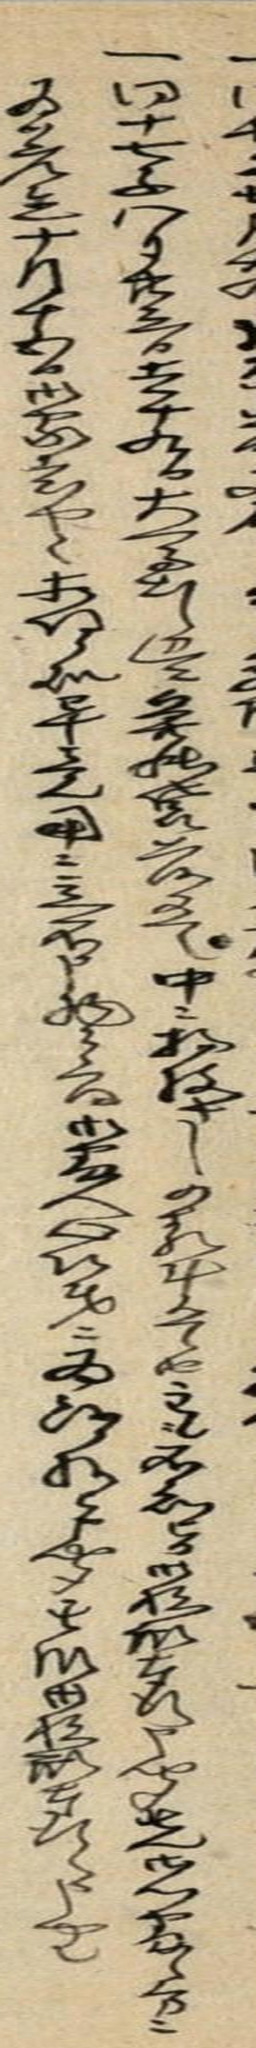為差置十月十五日御家老中へ相伺候処畢竟用に立不申物に候間御番人心次第に為致候様被申聞其段御杉形奉行へ申聞候
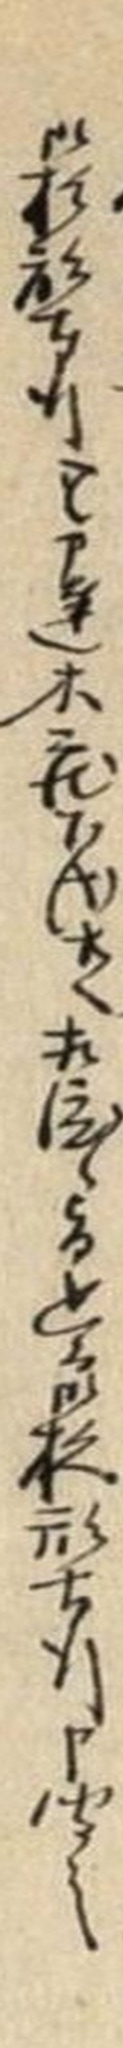御杉形奉行へ被申達木蔵下代共へ相渡候旨追て御杉形奉行申聞之

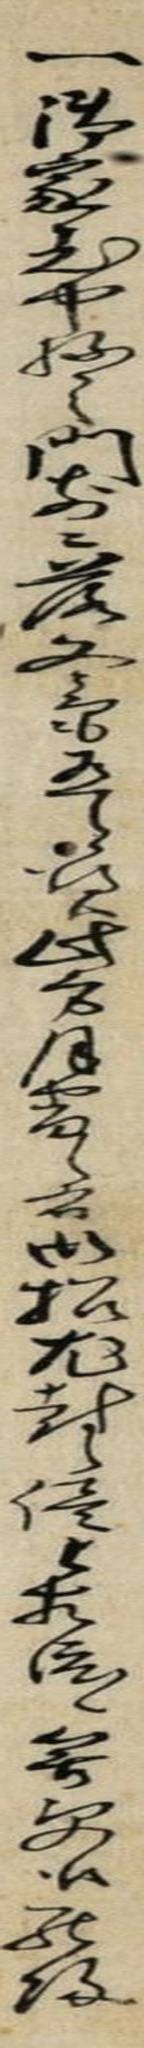一御家老中抔之門前に落文にても有之候得は此方月番之者御招尤封之儘被相渡候筈受取罷帰
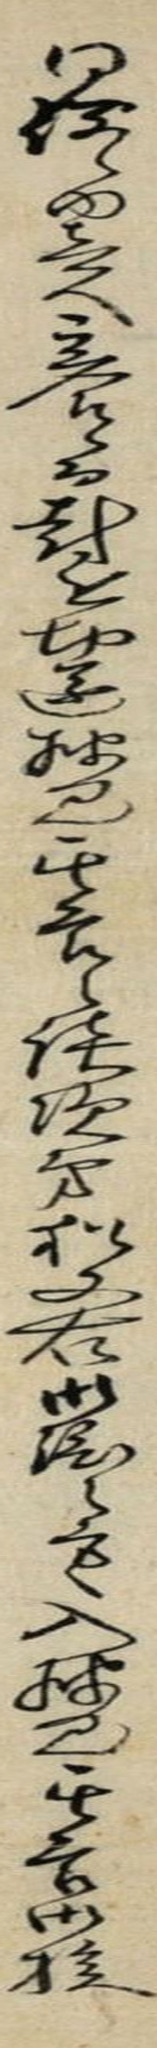同役之内壱人立合候て封を切遂披見其節之談次第猶又右御渡之方へ入披見其節御挨
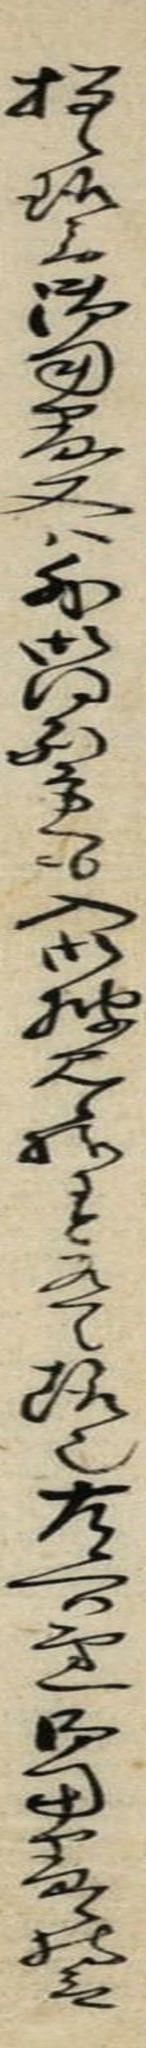拶之趣にて御用番又は外御同列方へも入御披見候様にと有之趣也左候へは第一御用番へ持参
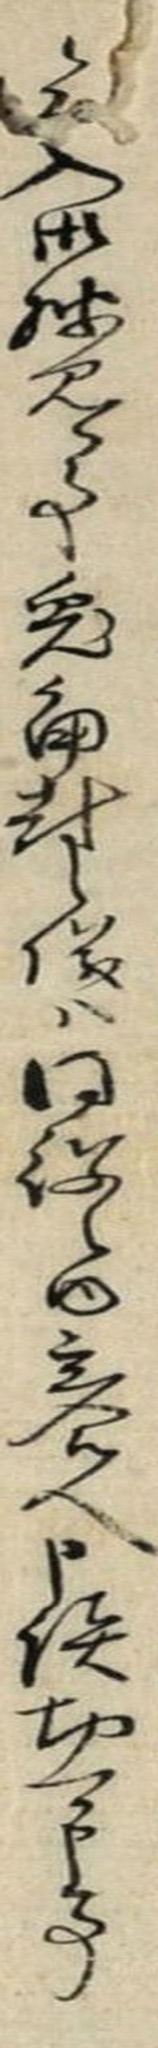候て入御披見候事兎角封之儀は同役之内立合人申談切可申事
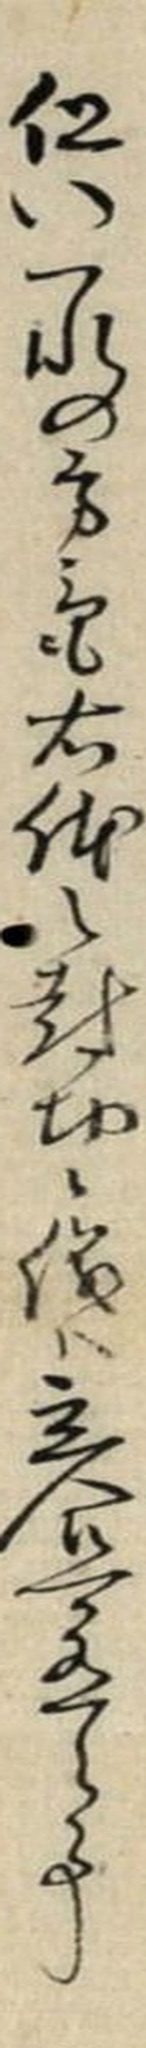但いつれの方にても右体之封切候儀は立合可有之事
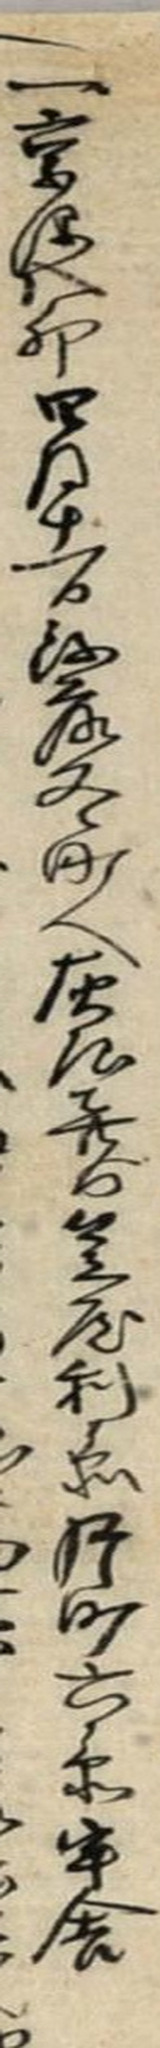一享保八卯四月十一日致落文候町人灰屋喜右衛門笠屋利兵衛片町六兵衛牢舎
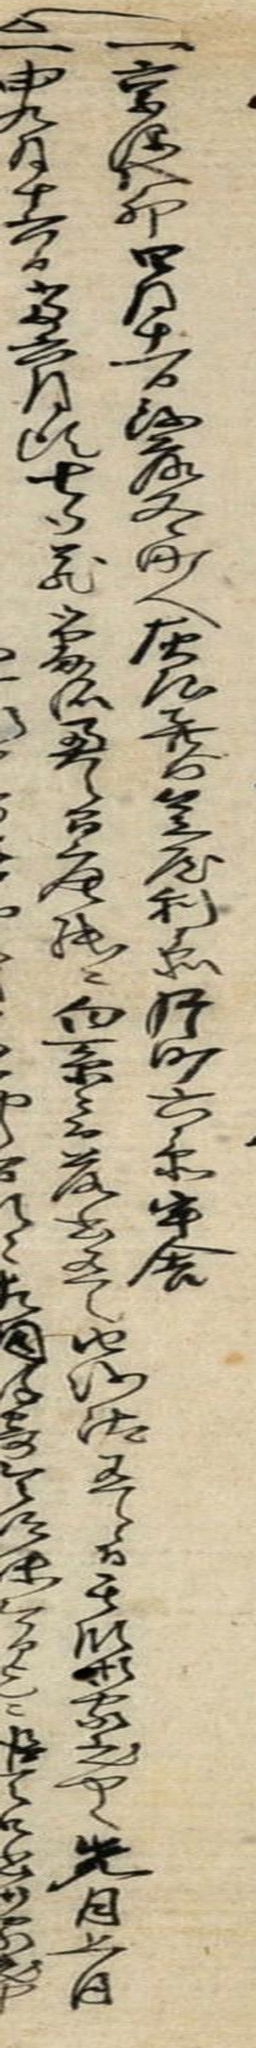△一申九月十六日当六月比七ツ蔵御番所奥之間唐紙に白一色にて落書有之由沙汰有之候に付其段御家老中へ先月上月
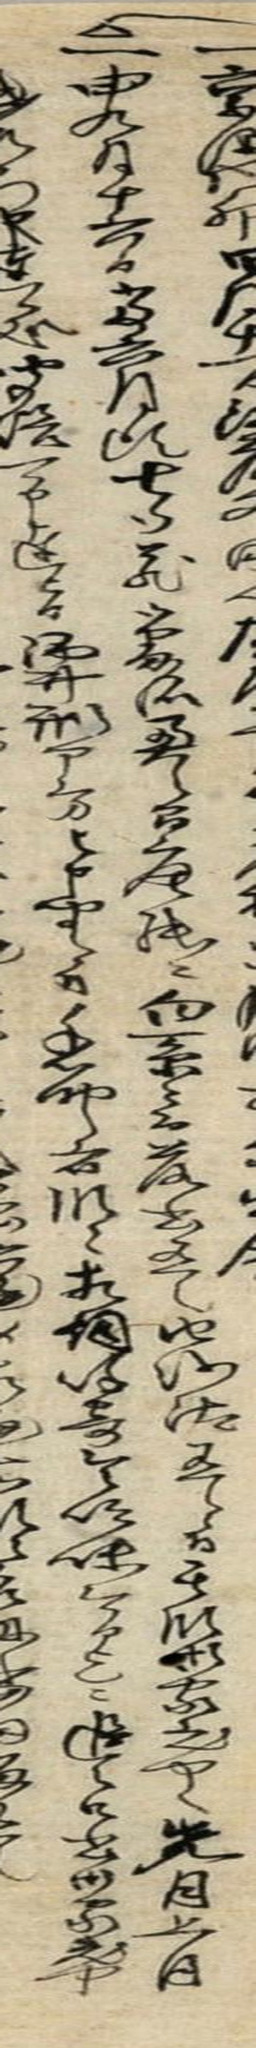武左衛門申達候処聞繕可申達旨酒井刑部方被申聞候に付手筋之者段々相調呼寄令吟味今日迄に追々口書御家老中
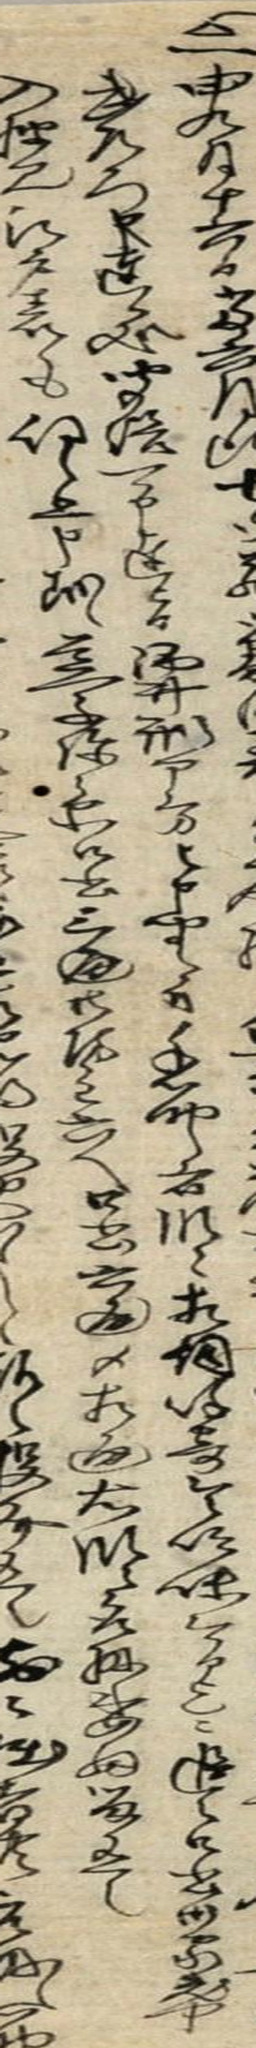入披見江戸表へも伺之上申越候荒子弥兵衛口書三通御坊主六人口書六通〆相通右段々取扱委細留有之
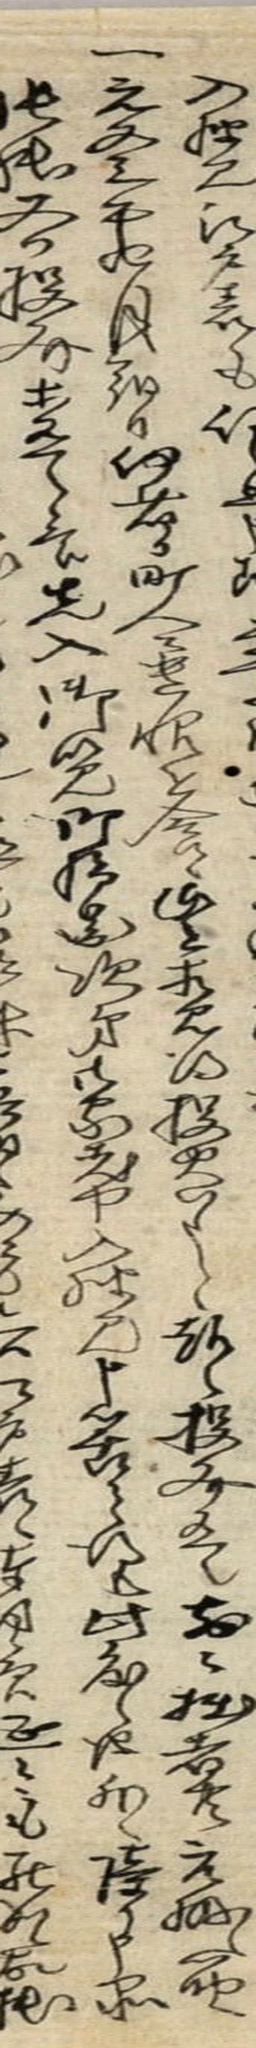張紙又は投文等有之候節先入御覧御指図次第御家老中入披見申筈に候得共此度之儀外へ障り申品
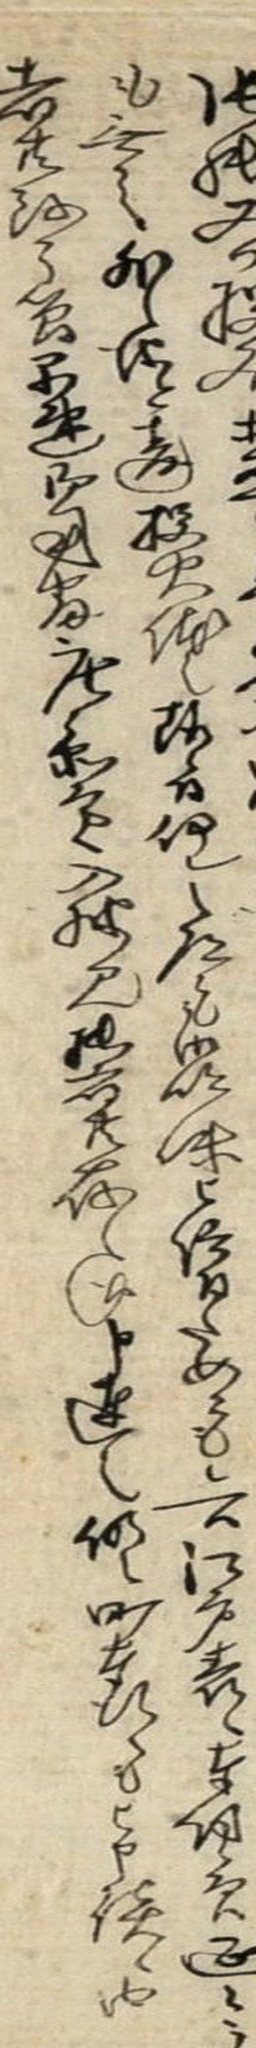者共致了簡早速御用番庄兵衛方へ入披見拙者共存候趣申達之仍之町奉行へも被申談候由
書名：御停止異変死失
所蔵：福井県文書館 Fukui Prefectural Archives
